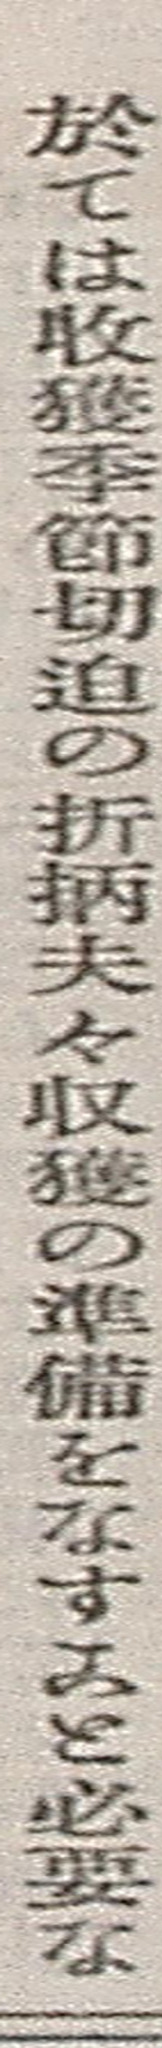於ては収穫季節切迫の折柄夫々収穫の準備をなすこと必要な
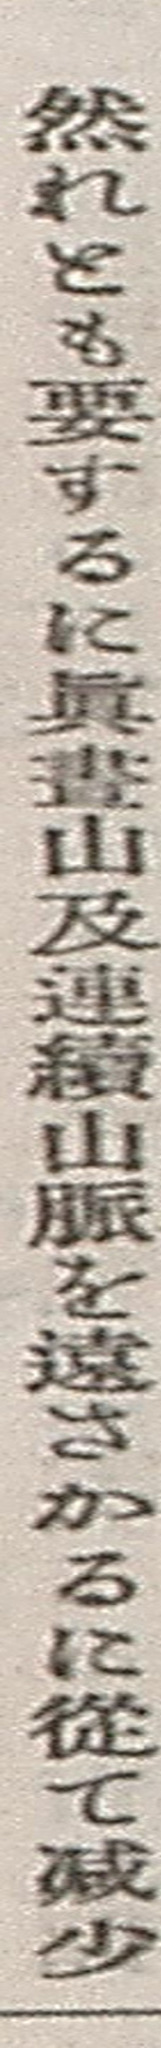然れとも要するに真昼山及連続山脈を遠さかるに従て減少
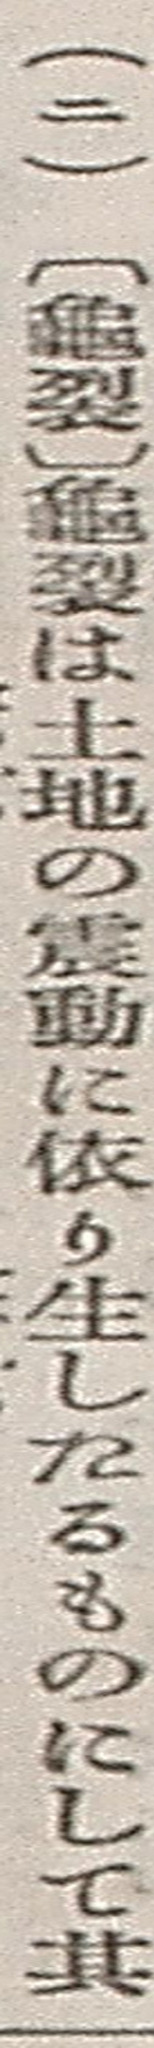[亀裂]亀裂は土地の震動に依り生したるものにして其
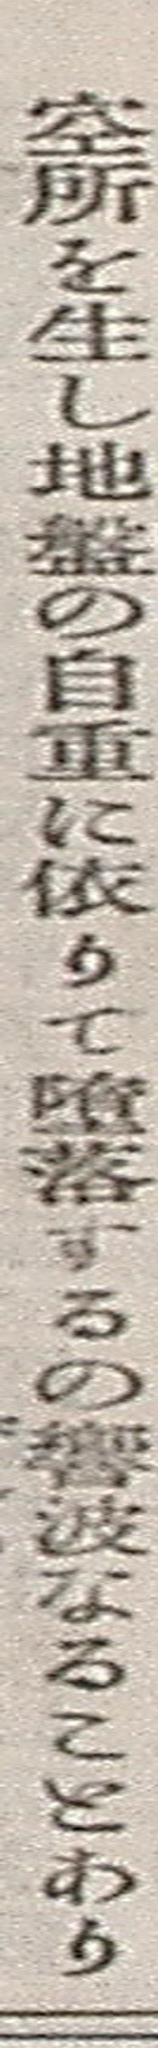空所を生し地盤の自重に依りて堕落するの響波なることあり
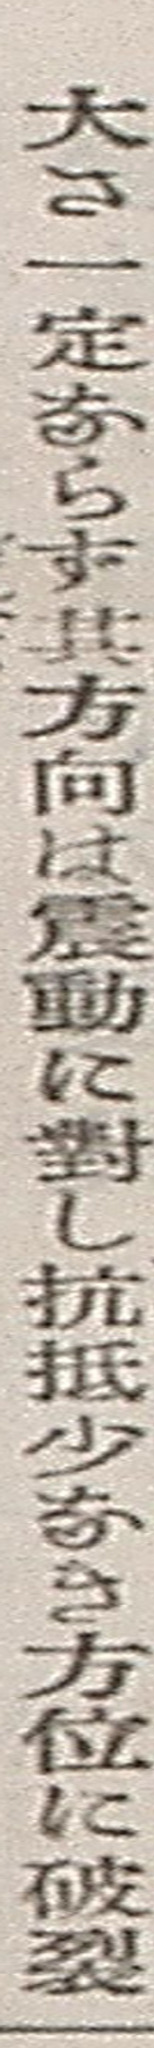大さ一定ならず其方向は震動に対し抗抵少なき方位に破壊
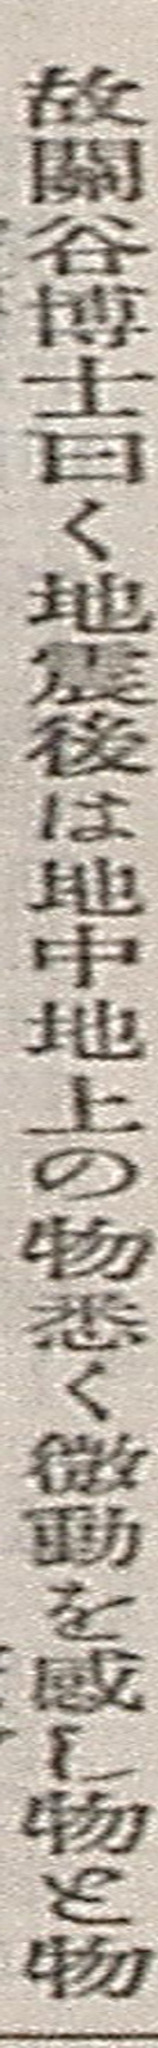故関谷博士曰く地震後は地中地上の物悉く微動を感し物と物
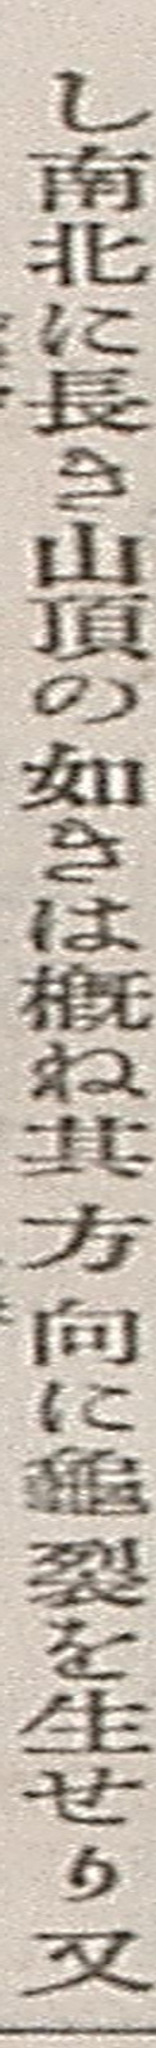し南北に長き山頂の如きは概ね其方向に亀裂を生せり又
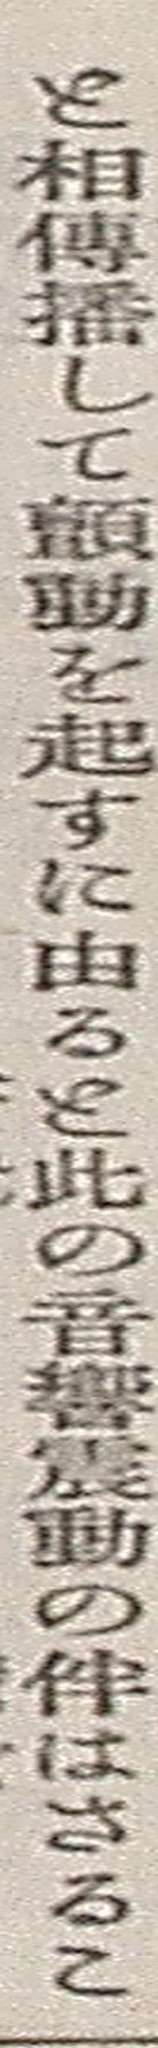と相伝播して顫動を起すに由ると此の音響震動の伴はさるこ
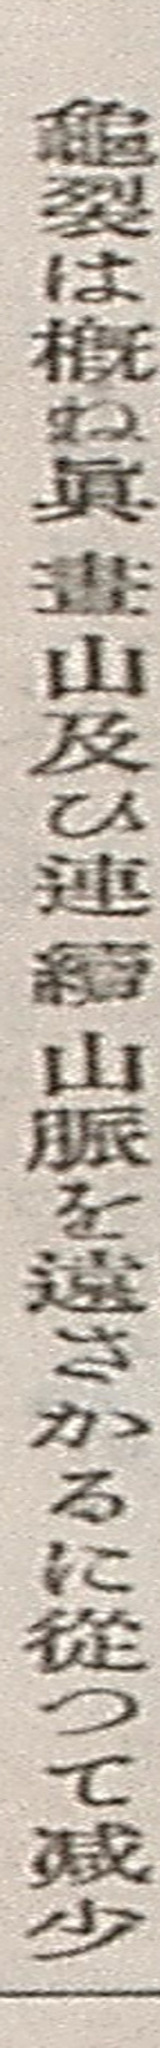亀裂は概ね真昼山及ひ連続山脈を遠さかるに従つて減少
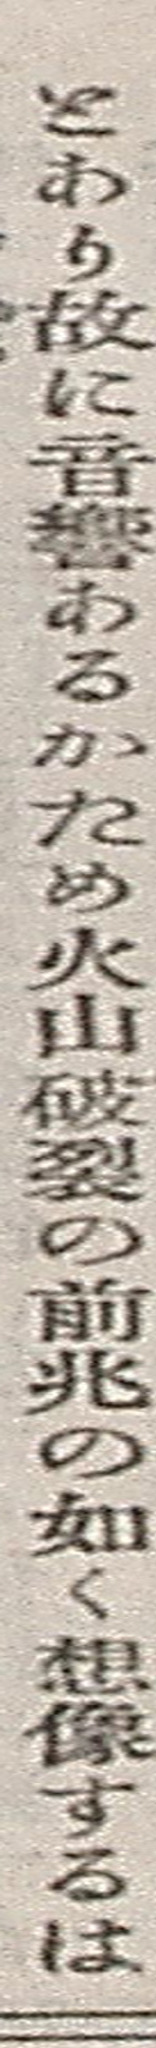とあり故に音響あるかため火山破裂の前兆の如く想像するは
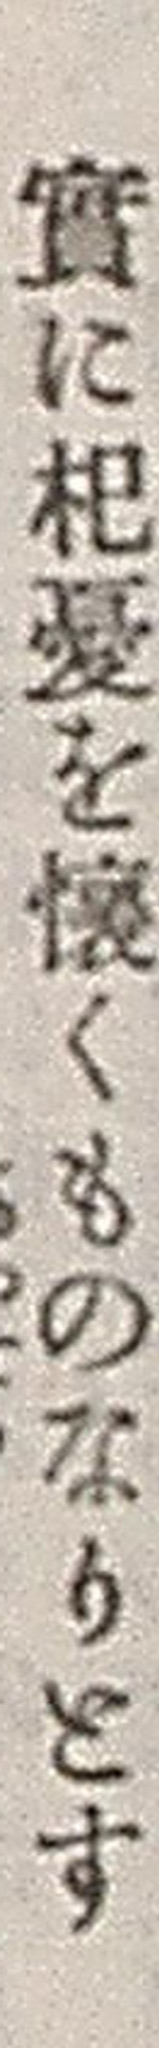実に杞憂を懐くものなりとす
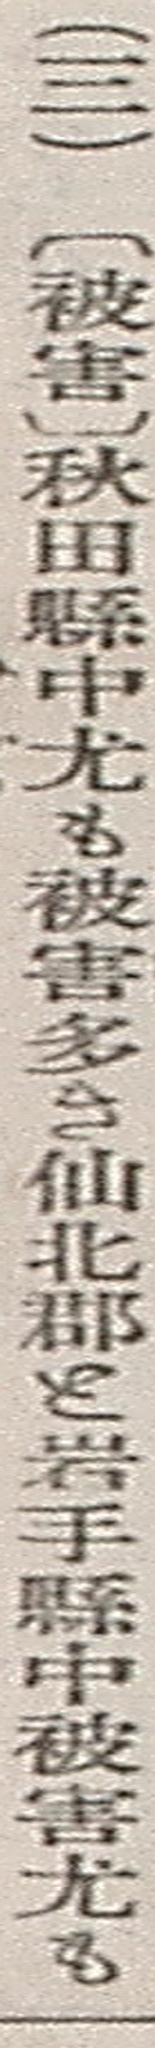[被害]秋田県中尤も被害多き仙北郡と岩手県中被害尤も
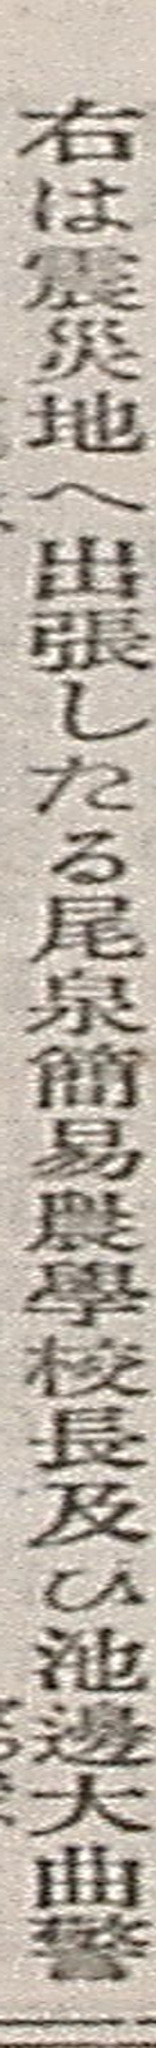右は震災地へ出張したる尾泉簡易農学校長及ひ池辺大曲警
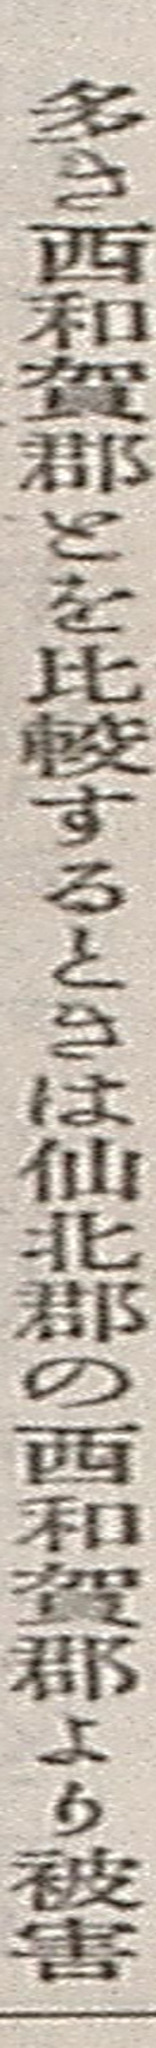多き西和賀郡とを比較するときは仙北郡の西和賀郡より被害
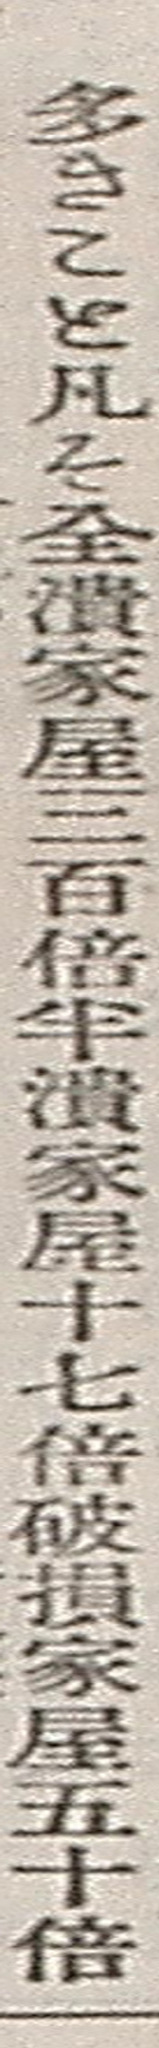多きこと凡そ全潰家屋三百倍半潰家屋十七倍破損家屋五十倍
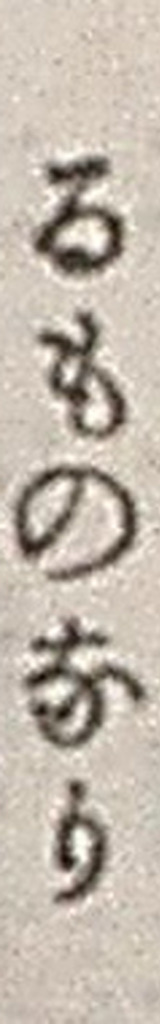るものなり
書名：風俗畫報臨時増刊第百二十四號　洪水地震被害録（上）
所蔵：東京大学地震研究所図書室 Earthquake Research Institute Library, The University of Tokyo, JAPAN
